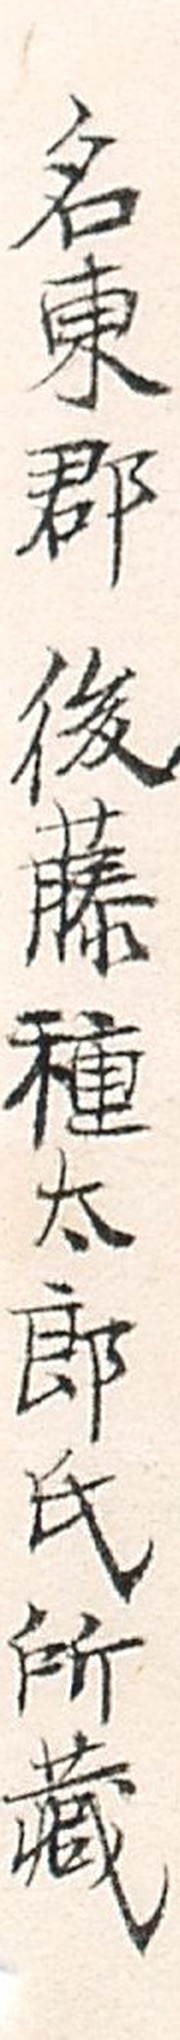名東郡後藤種太郎氏所蔵

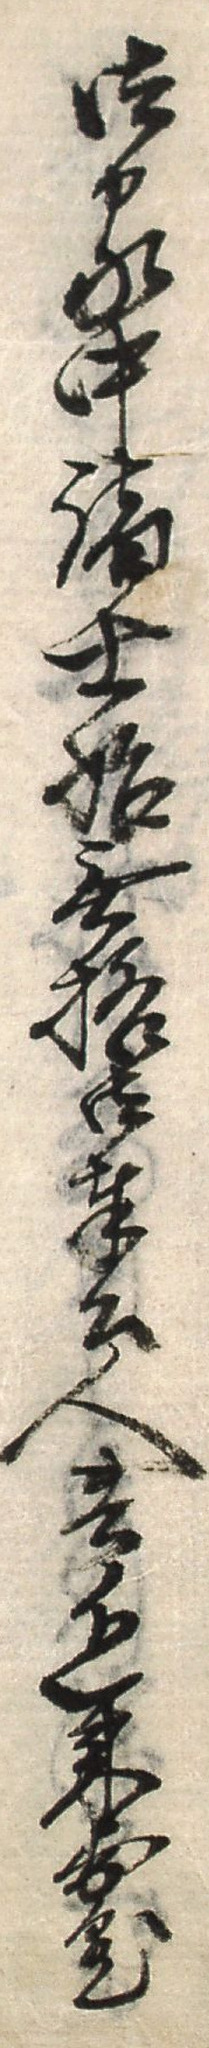御家中諸士始無格御奉公人共近来歩懸
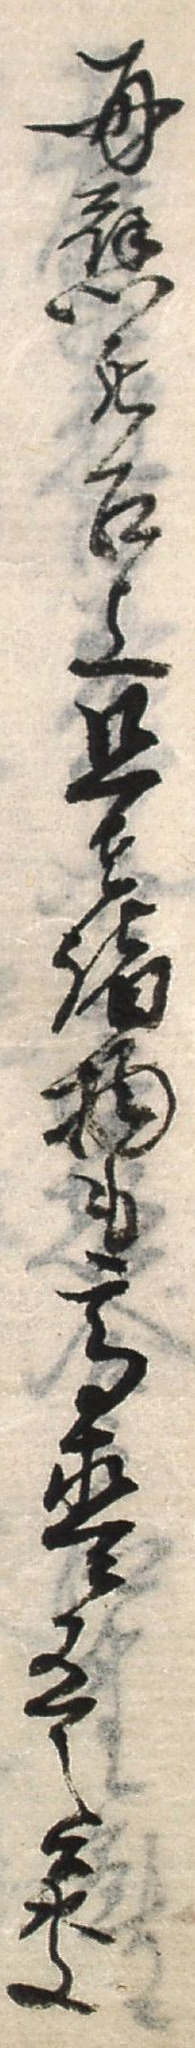再応被召上且は諸物も高直に有之候処
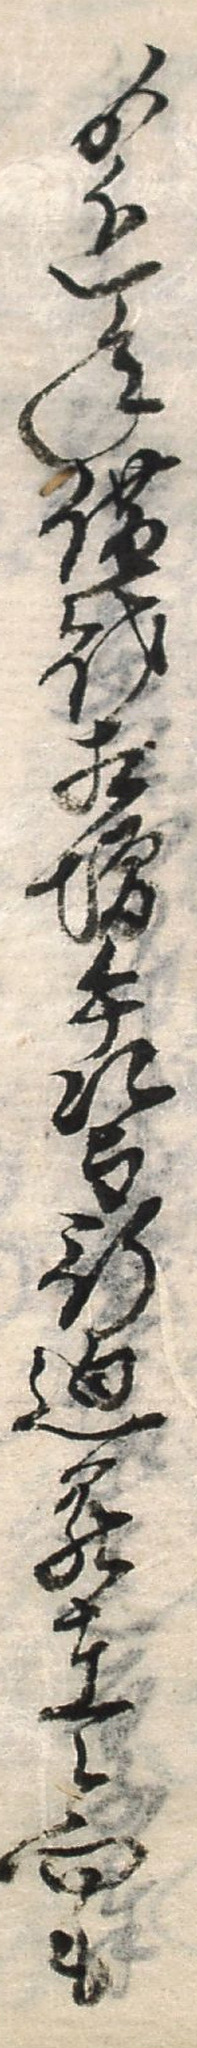ゟ近年借財相増犇与行迫罷在候向も
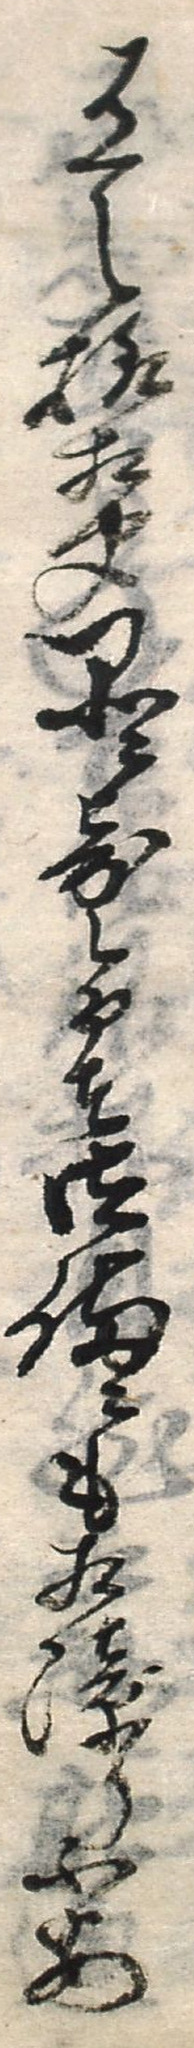有之様相聞品に寄候而は御備にも相障り不安
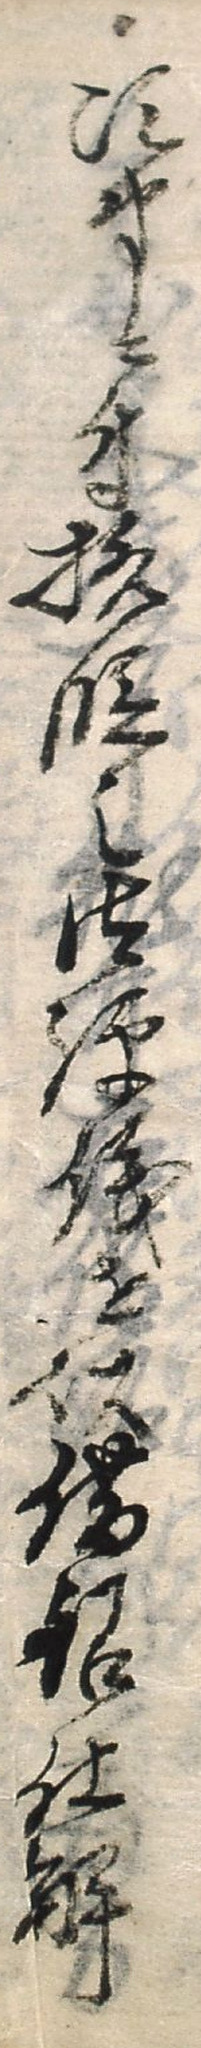次第に付格段之御評儀を以借銀仕解
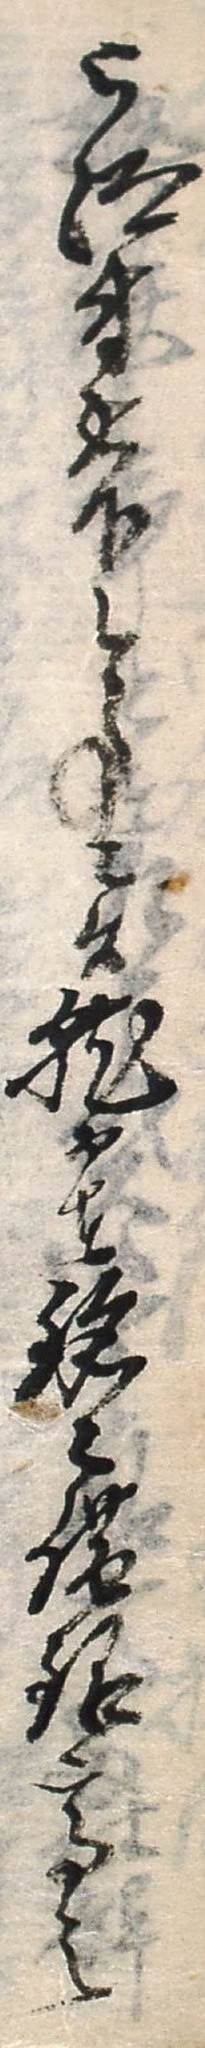被仰付被下候事に候然而は銘々借銀高之
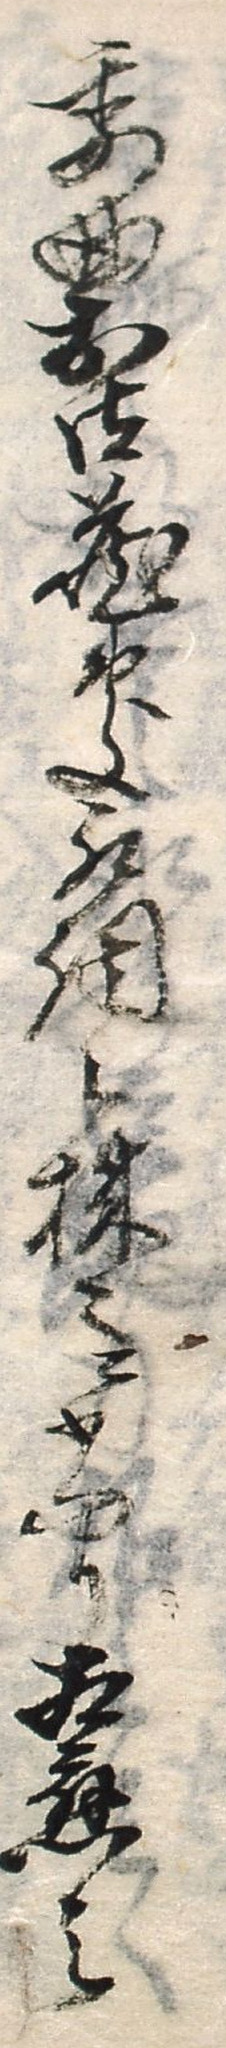委曲於御蔵処取調候株々に当り相応之
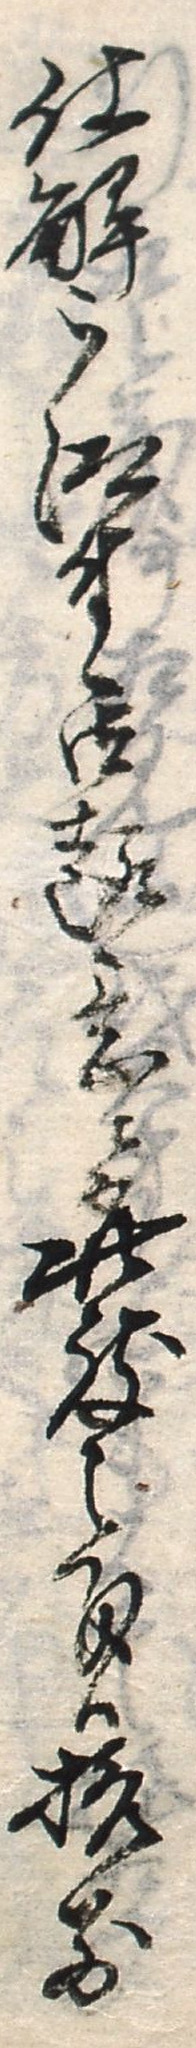仕解被仰付候御趣意に而此度之義は格別
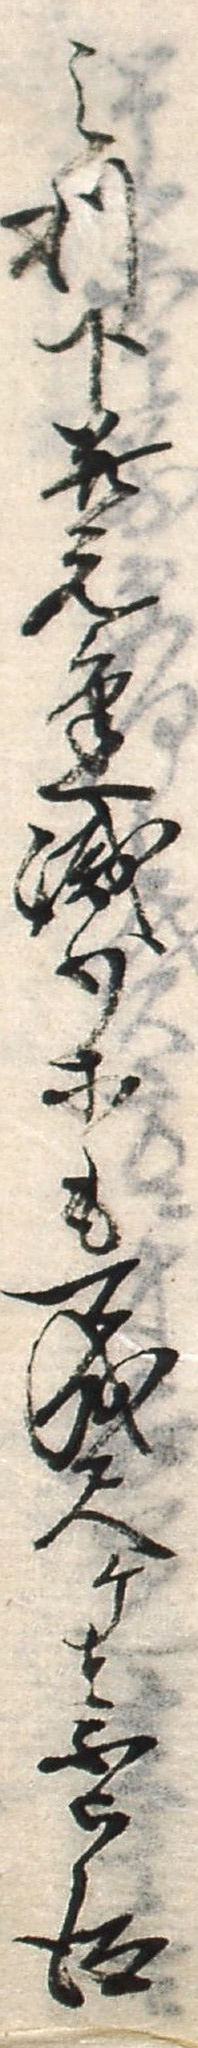之利下幷元金滅少等も可成丈けは不被仰
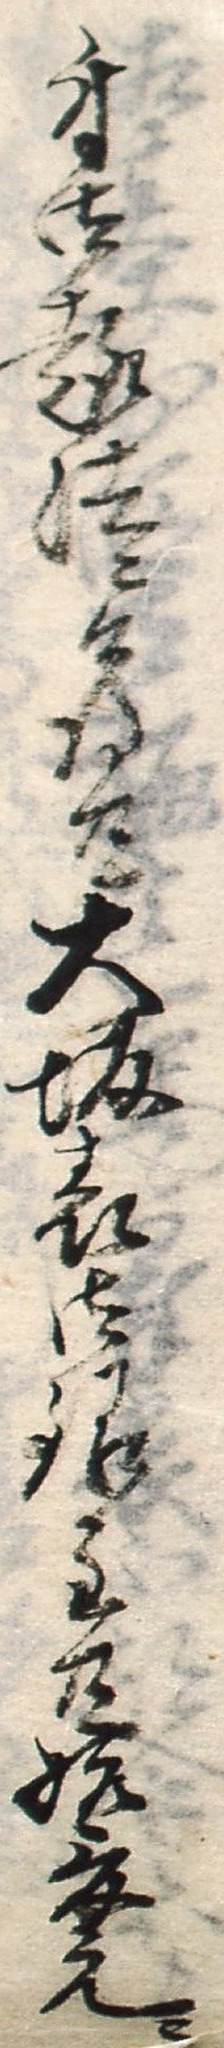付御趣法に候得共大坂表御銀主共始爰元に
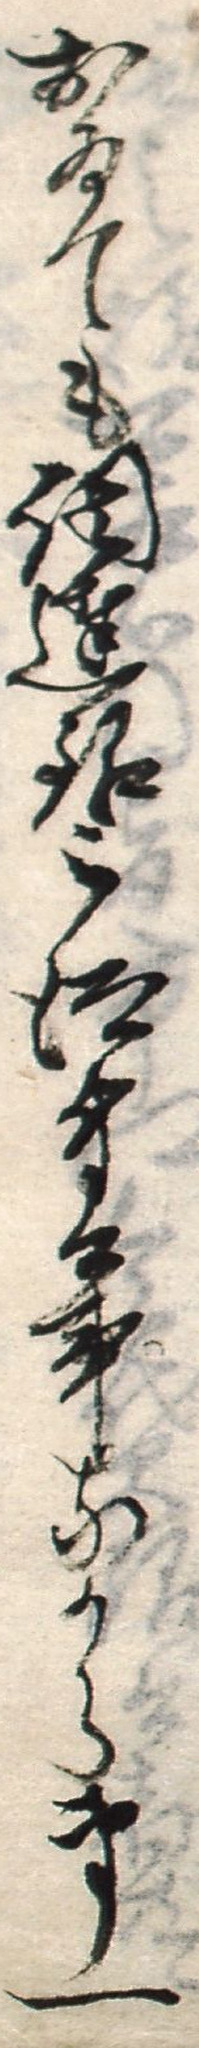おゐても調達銀被仰付候事なから第一
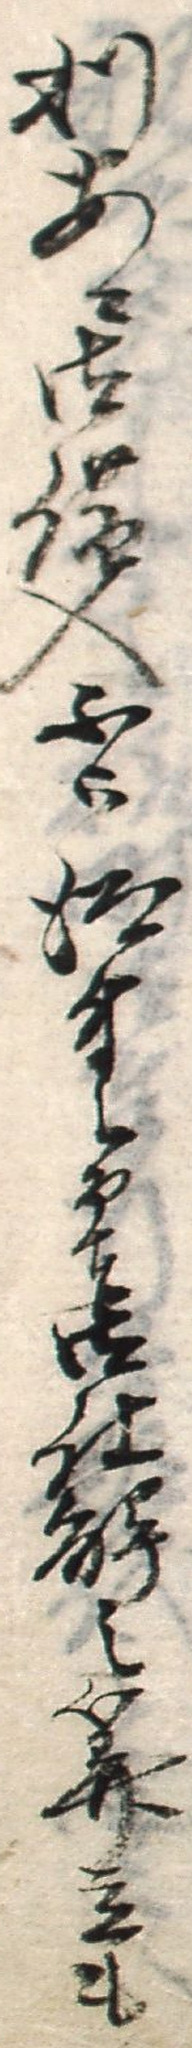利安に御借入不被仰付候而は御仕解之算立も

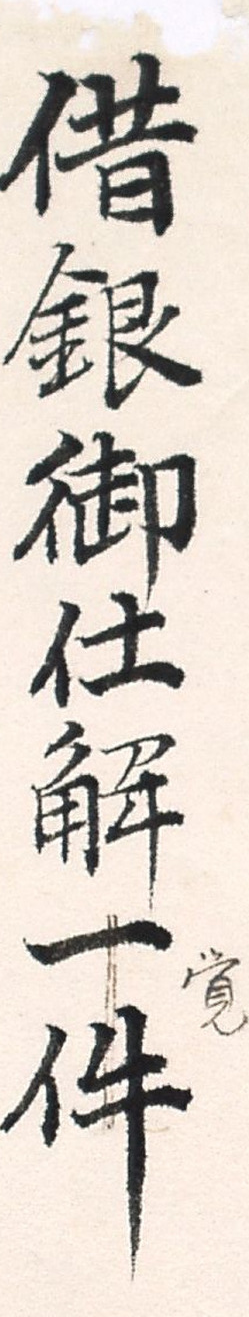借銀御仕解覚
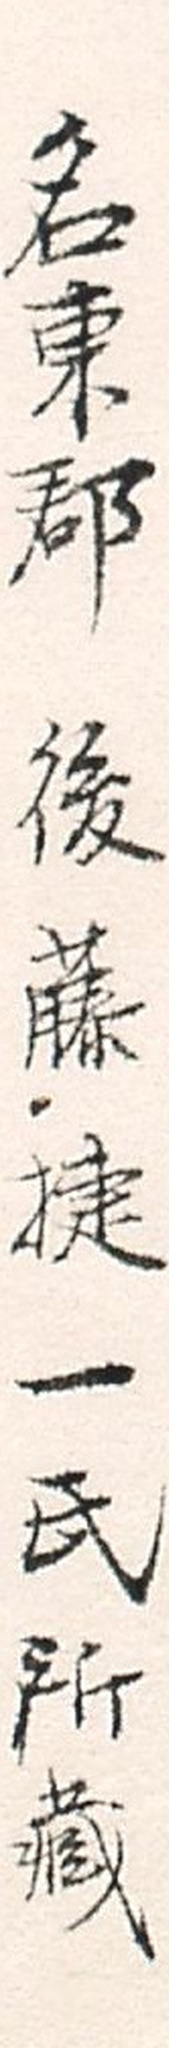名東郡後藤捷一氏所蔵

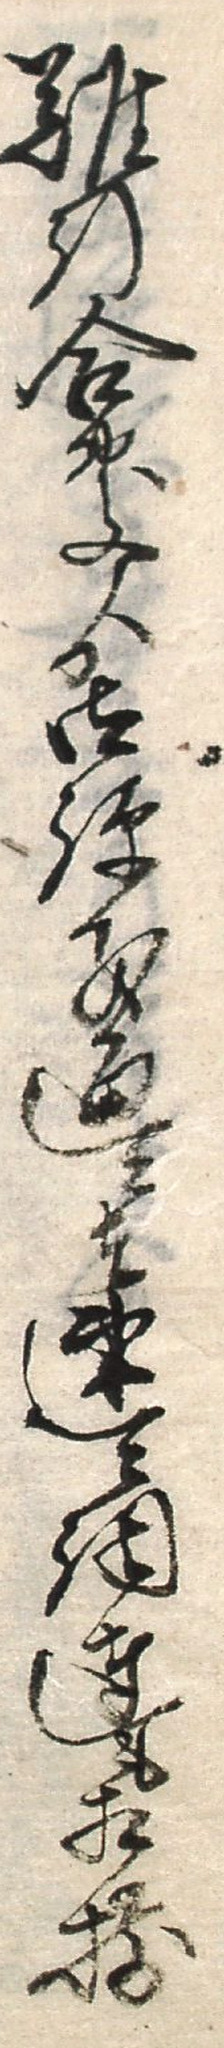難引合処ゟ御評義通には速に調達も相揃
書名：御家中并無格御奉公人借銀御仕解一件御書付写其余共控
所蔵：鳴門教育大学 Naruto University of Education
